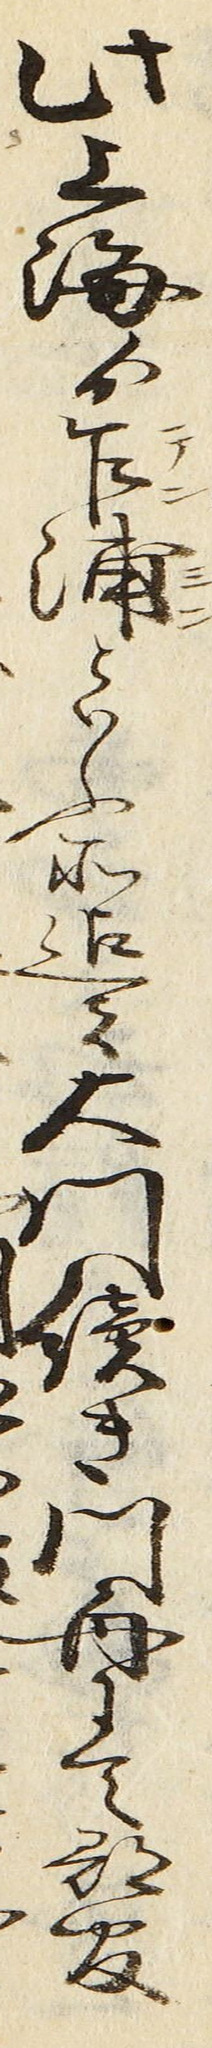此上海ゟ乍浦といふ所迄は大川続き川舟にて郡官
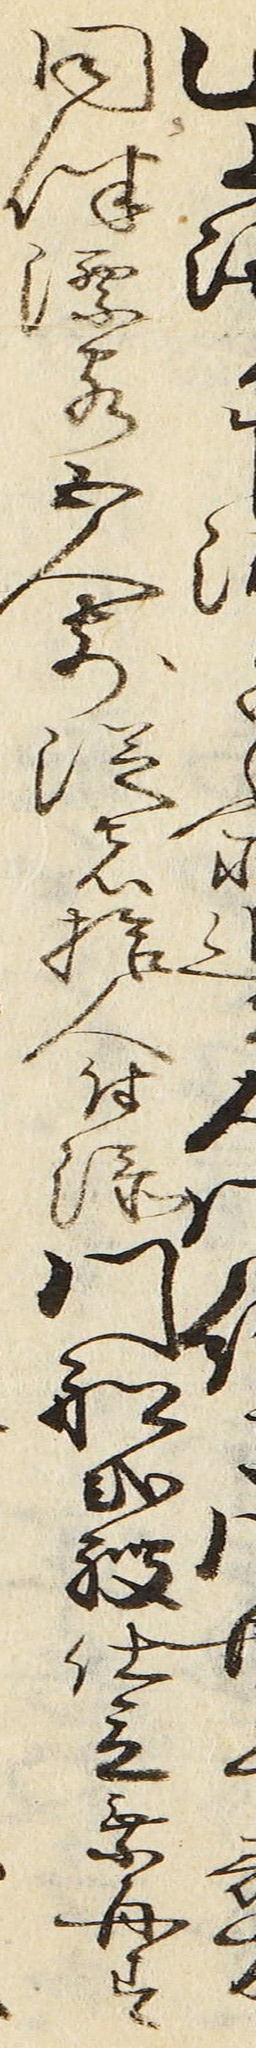同伴漂客五人前従者拾人付添川船弐艘仕立乗舟す
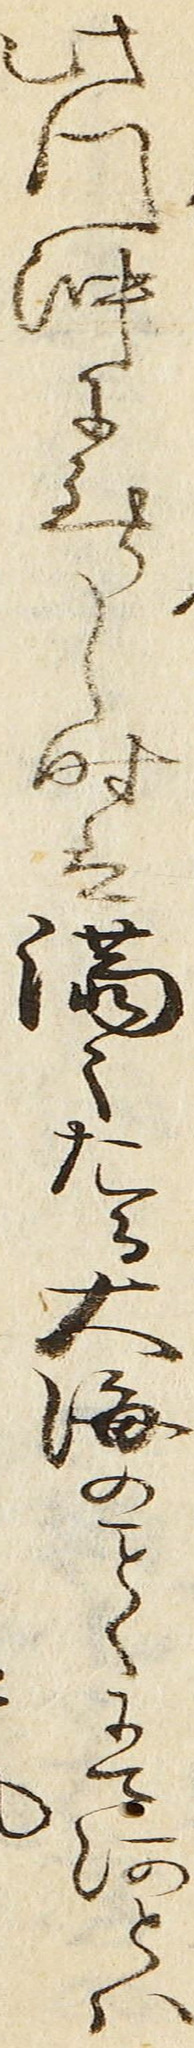此川沖に至りし時は満々たる大海のことくにて河とハ
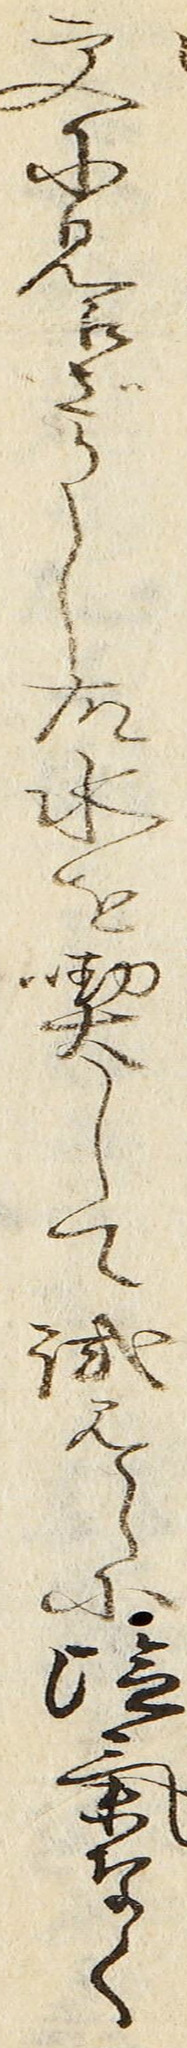更に見えざりし故水を喫して試見しに塩気なく
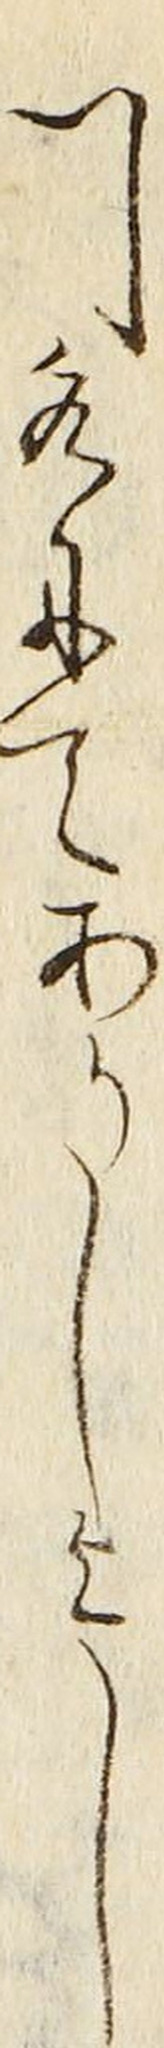川水にてありしよし
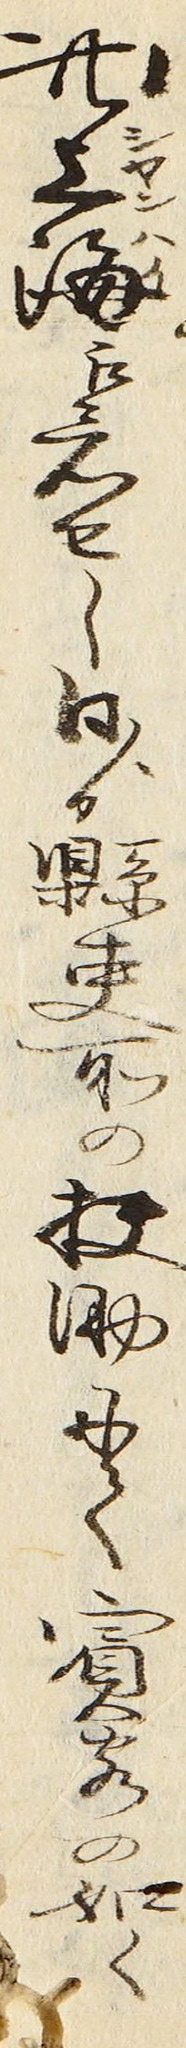此上海え着セし日ゟ県吏所の扶助にて賓客の如く
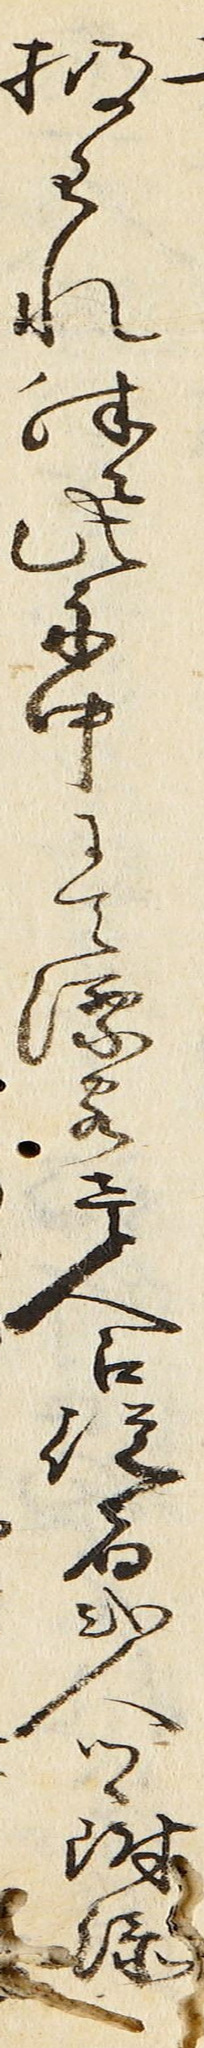扱われ殊ニ此舟中にて漂客壱人え従者弐人ツヽ付添
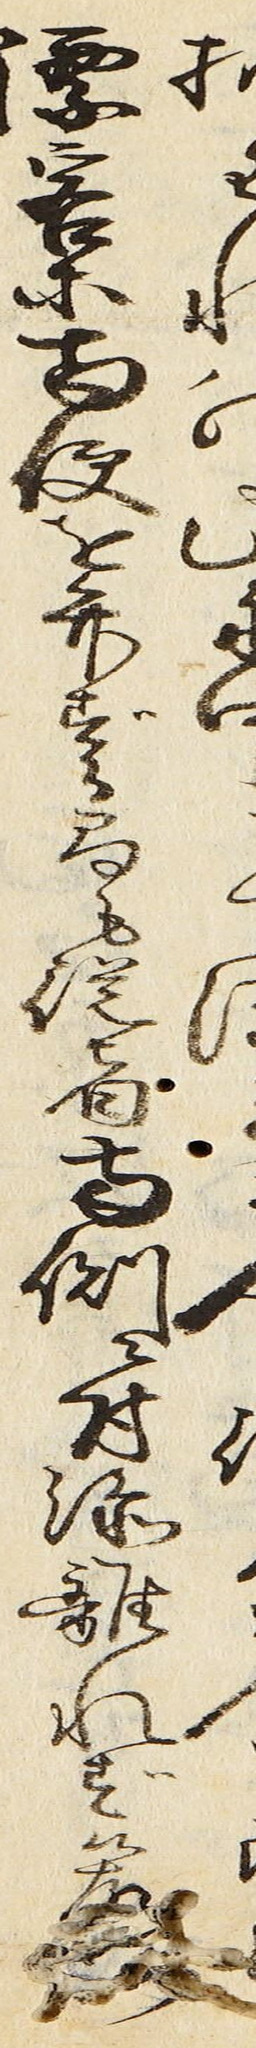漂客等両便を弁ずる間も従者両側ニ付添離れず候故
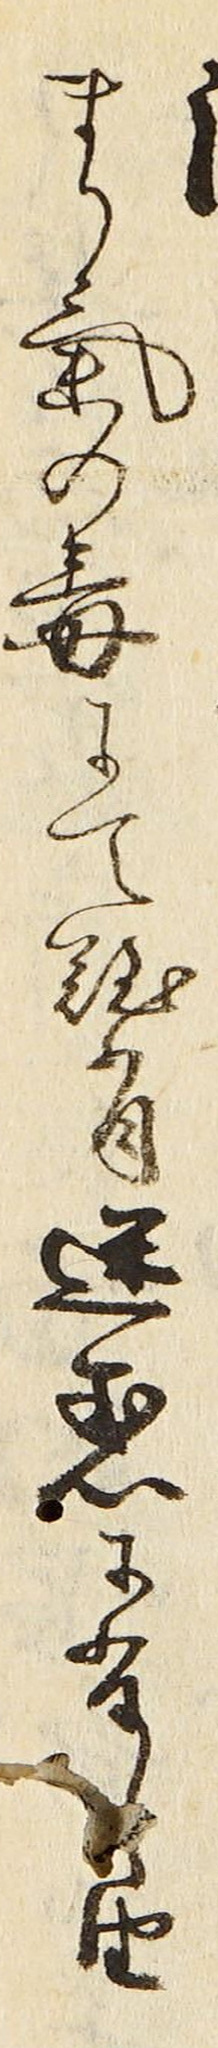まり気の毒にて難有迷惑に有し由
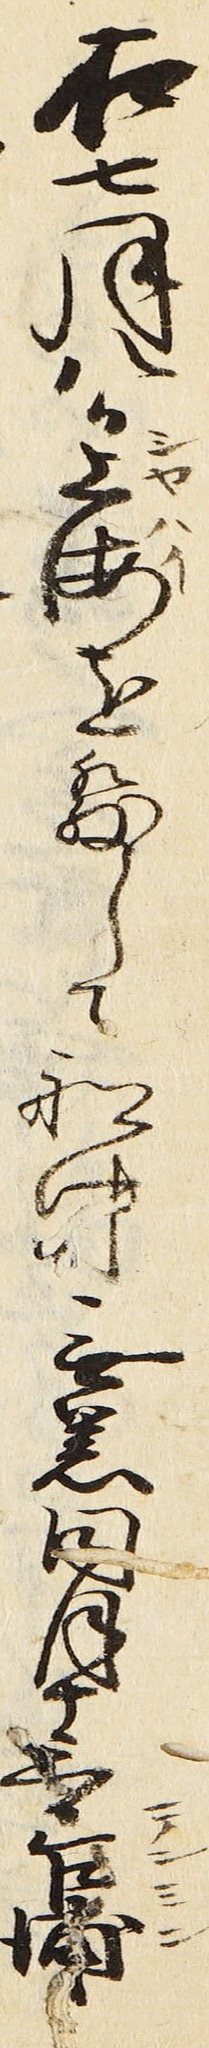右七月八日上海を発して船中無恙同月十三日乍浦
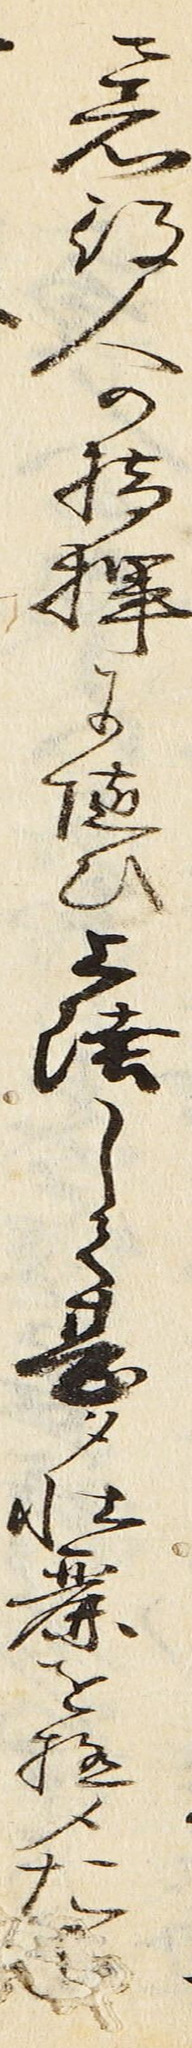ニ着役人の指揮に随ひ上陸して甚タ壮麗を極メたる
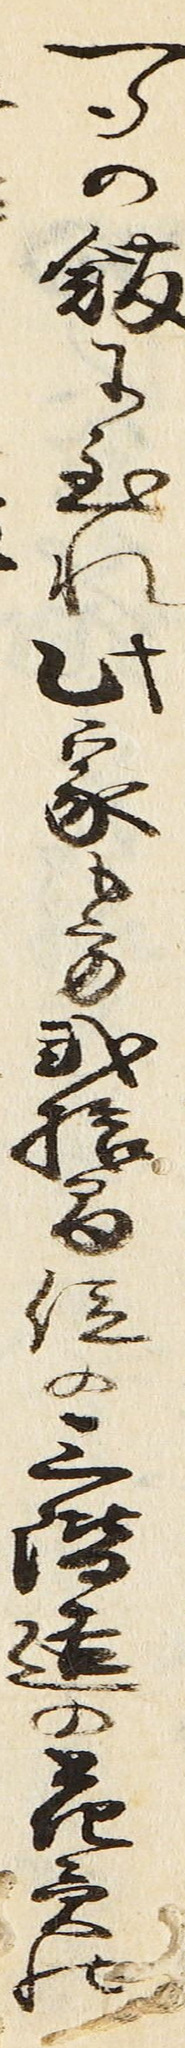一ツの館に至れ此家も方弐拾間位の三階造の花美の
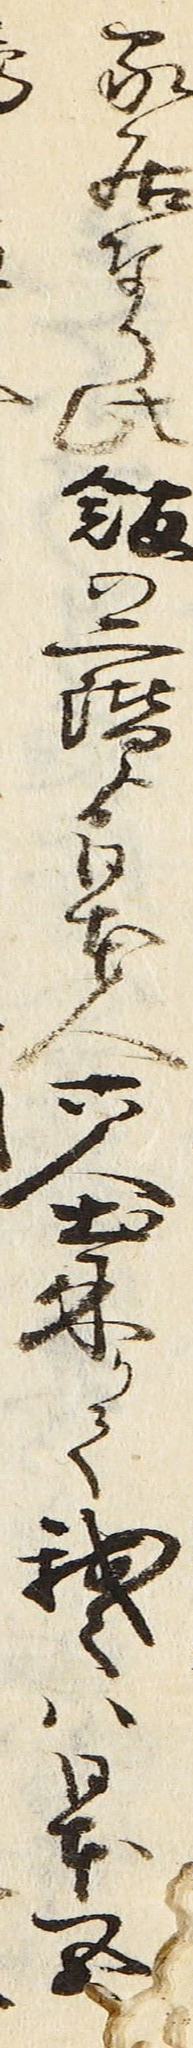家居なり此館の二階ゟ日本人六人出来りて我々ハ日本五
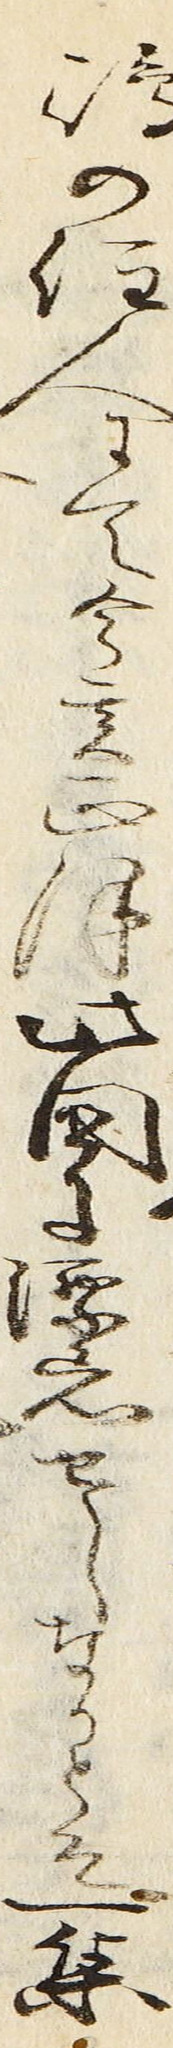島の住人にて今亥正月此国に漂着セしなりとそ一集
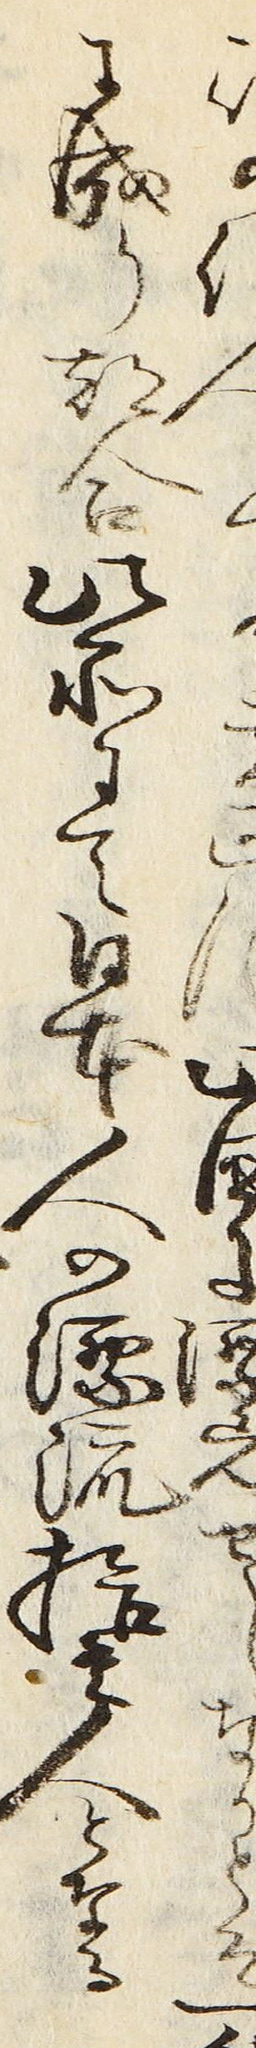に成り都合此所にて日本人の漂流拾壱人となる
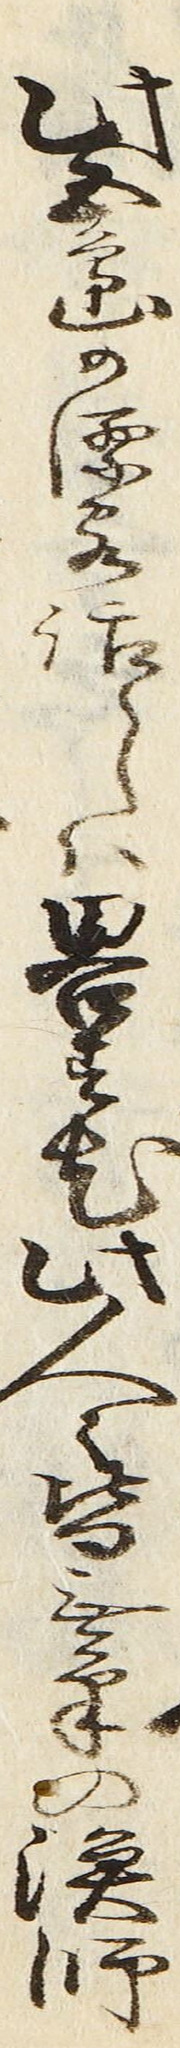此五島の漂客話しハ略す尤此人は皆無筆の漁師
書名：亜墨利加漂流記聞
